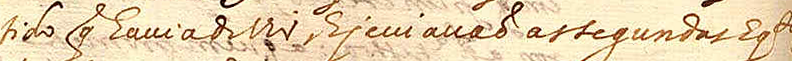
tido q̄ hauia de vir, E jeiuauaõ as segundas E qtas
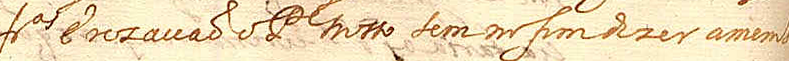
fras E rezauaõ o Pe nosso sem no fim dizer amem
